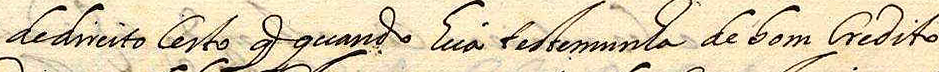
de direito Certo que quando huā testemunha de bom Credito
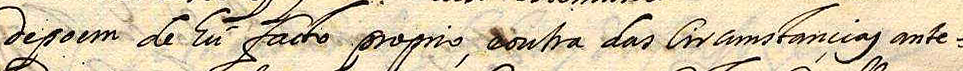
depoem de hū facto proprio, e outra das Circunstançias ante
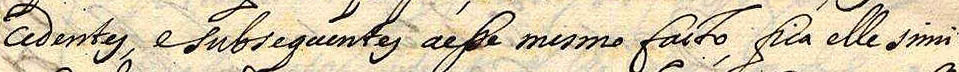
cedentes, e subsequentes a esse mesmo facto, fica elle simi
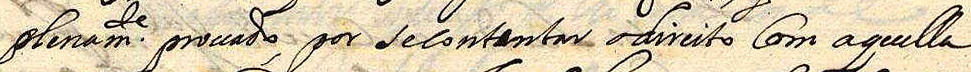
plenamte. prouado, por se contentar o direito Com aquella
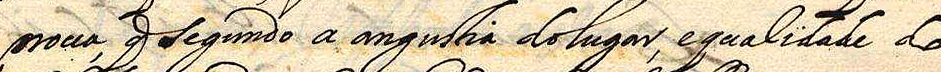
proua, q̄ segundo a angustia do lugar, e qualidade do
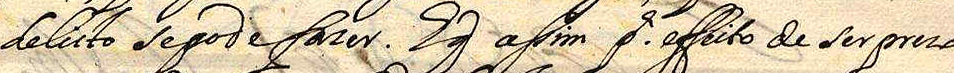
delicto se pode fazer. E q̄ assim p.a effeito de ser prezo
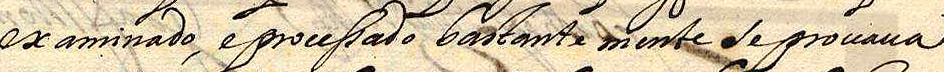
examinado, e processado bastantemente se prouaua
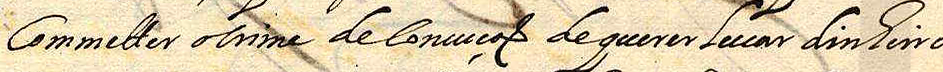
Commetter o crime de Conuição de querer leuar dinheiro
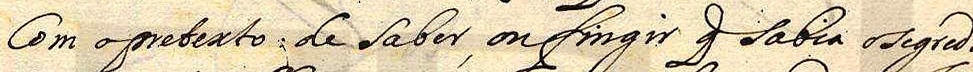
Com o pretexto de saber, ou fingir q̄ sabia o segredo
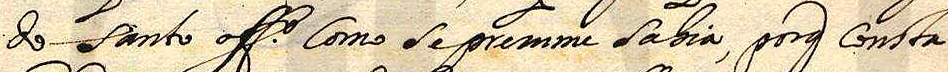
do santo off.o Como se presume sabia, porq̄ consta
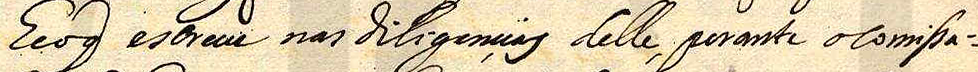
he o q̄ escreue nas diligençias delle, perante o comissa
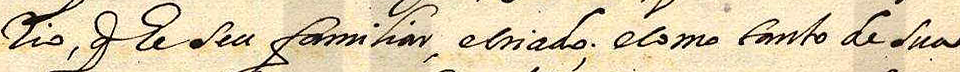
Rio, q̄ he seu familiar, e criado; e como tanto de sua
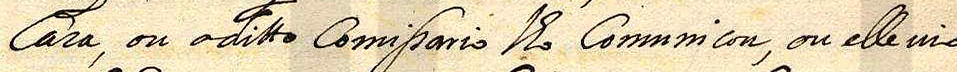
Caza, ou o ditto Comissario lho Comunicou, ou elle uio
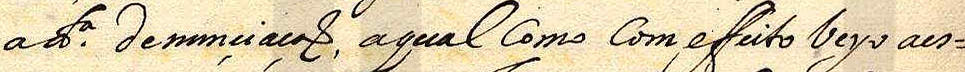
a d̄.a denunçiaçaõ, a qual Como Com effeito veyo a es
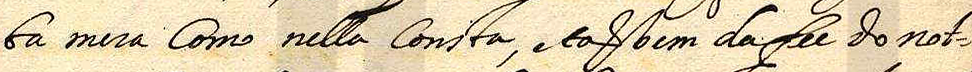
ta meza Como nella Consta, e taõbem da fee do not
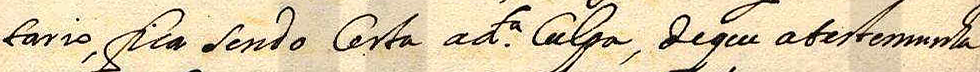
tario, fica sendo Certa a d̄.a Culpa, de que a testemunha
